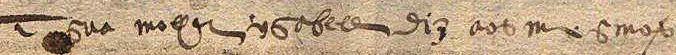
item sua molher ysabell diz aos mesmos
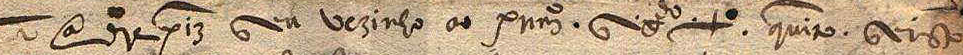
item ādre p̄iz seu vezinho ao primo . segdo . to . q̄uito . seisto
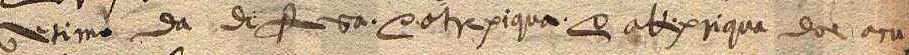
setimo da defesa. e a trepiqua. e a Repriqua dos acu
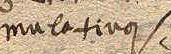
mulatiuꝯ/
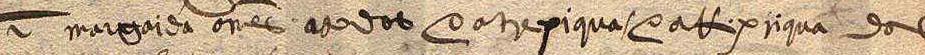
item margaida an̄es. a todos e a trepiqua/ e a Repriqua dos
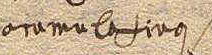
acumulatiuꝯ /.
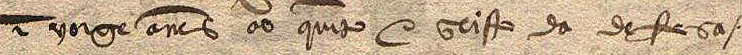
item yorge ānes ao q̄uito e seisto da defesa /.
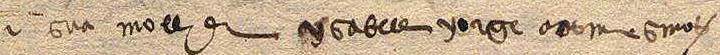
item sua molher ysabell yorge aos mesmos⁊
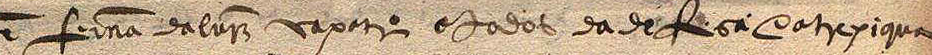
item fern̄a dalur̄z capatro a todos da defesa. e a trepiqua
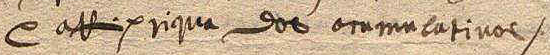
e a Repriqua dos acumulatiuos /.
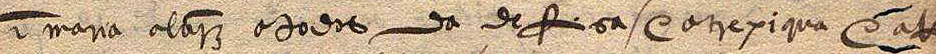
item maria alūrz a todos da defesa / e a trepiqua e a R
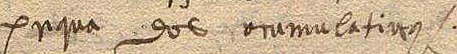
priqua dos acumultatiuꝯ /.
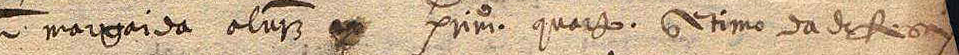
item margaida alūrz _ primo. quarto. setimo da defesa /
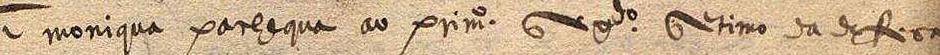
item moniqua pachequa ao primo. segdo. setimo da defesa
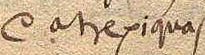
e a trepiqua/
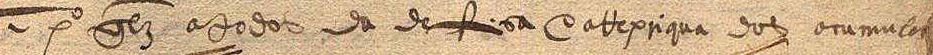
item po ḡlz a todos da defesa e a Repriqua dos acumula
